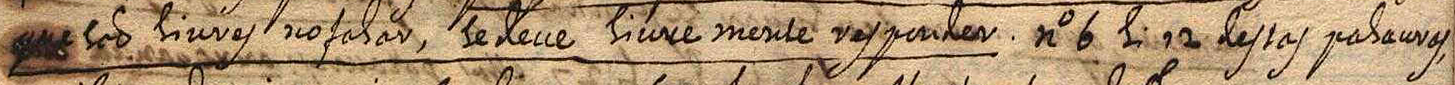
que saõ liures no falar, se deue liuremente responder. no 6 li 12 destas palauras,
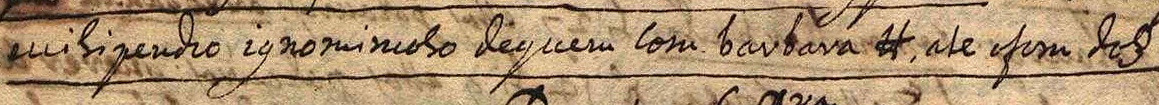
e uilipendio ignominioso de quem com barbara tt. ate o fim do §
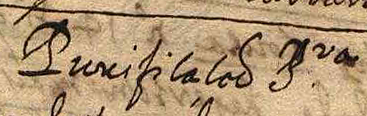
Purificaçaõ P.ra
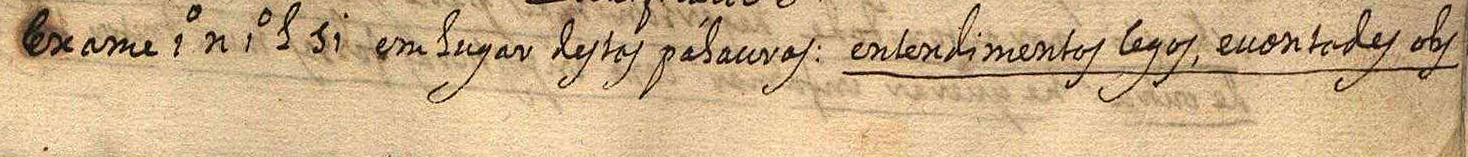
Exame 1o n 1o l 51 em lugar destas palauras: entendimentos cegos, e uontades obs
